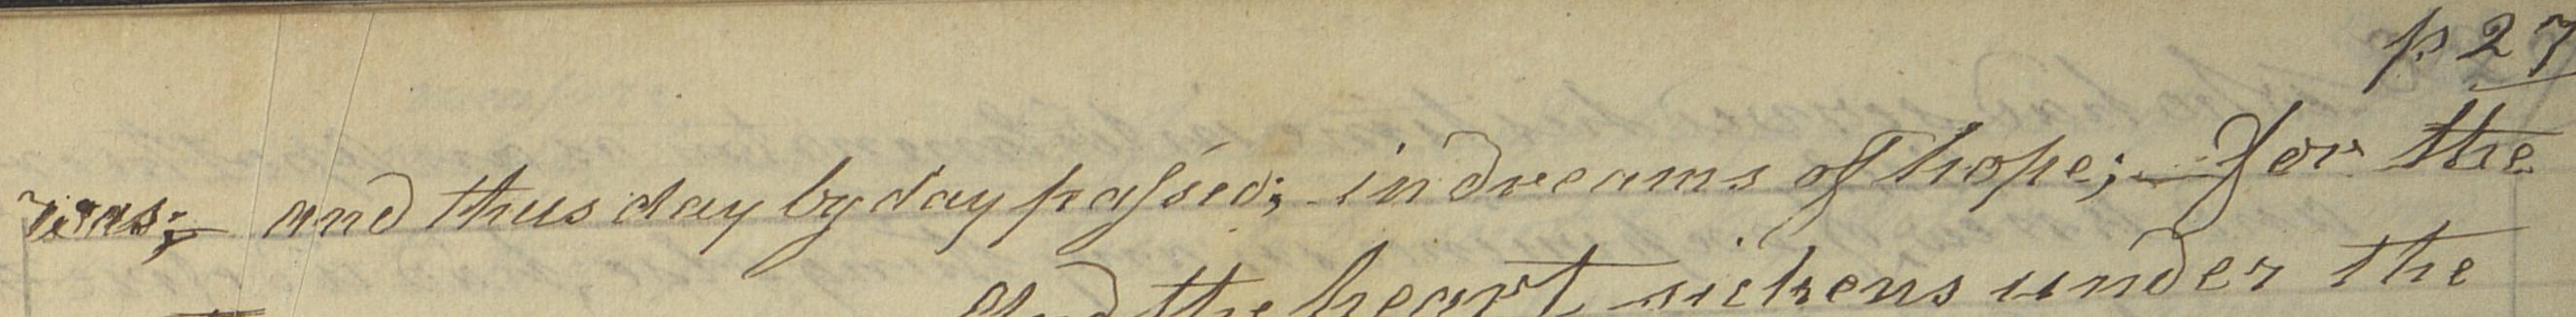was; and thus day by day passed; in dreams of hope; for the
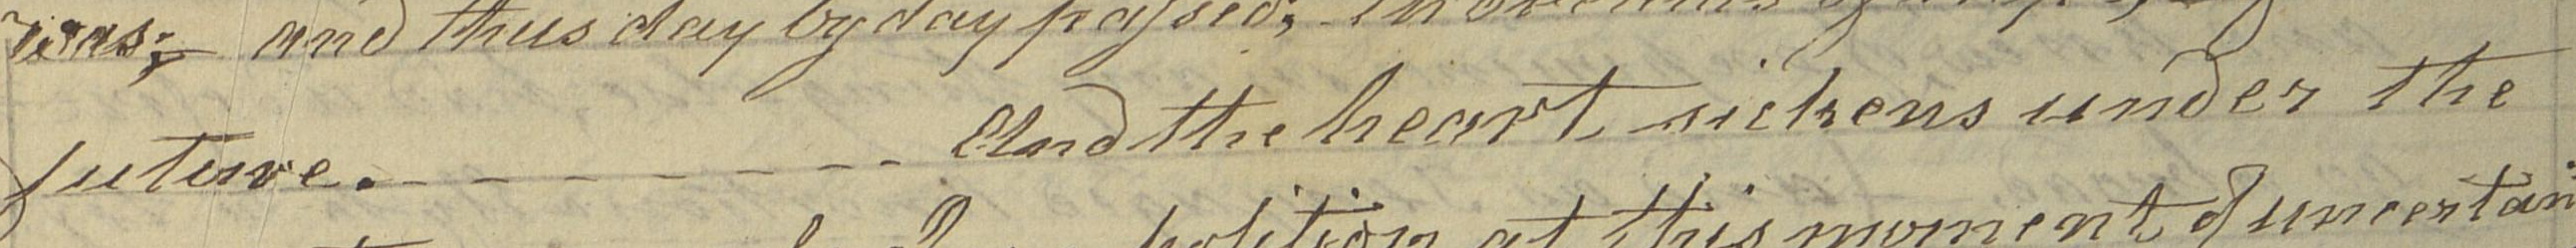future. And the heart sickens under the
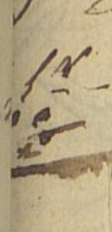-^r
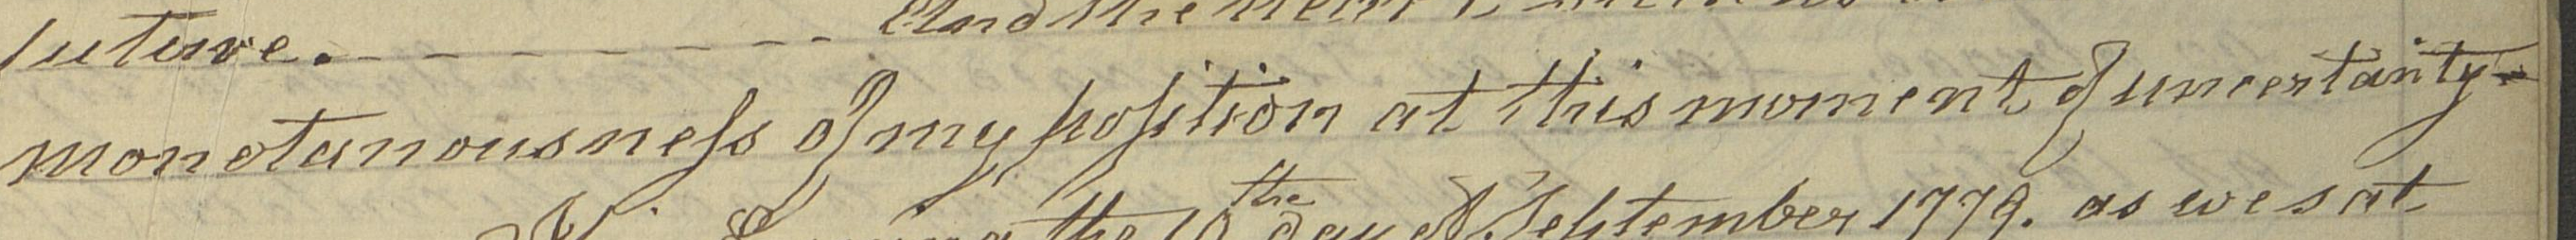monotanousness of my position at this moment of uncertainty.
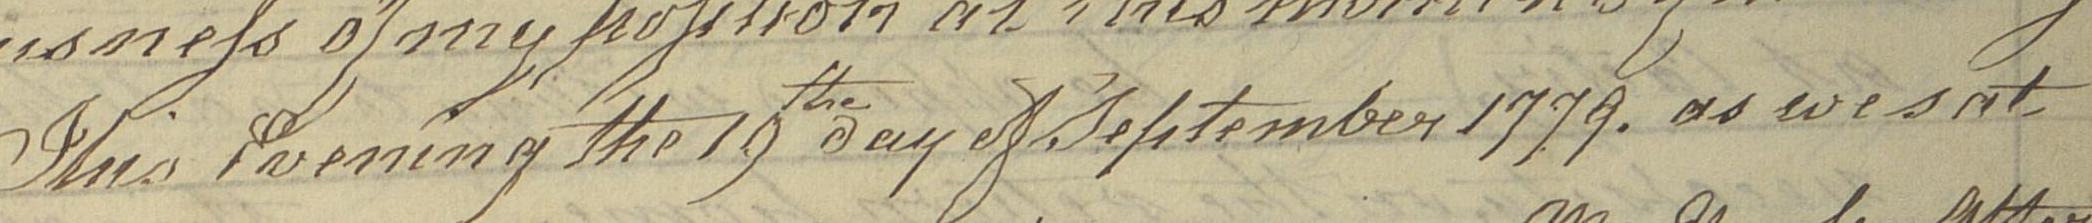This Evening the 19^th day of September 1779. as we sat
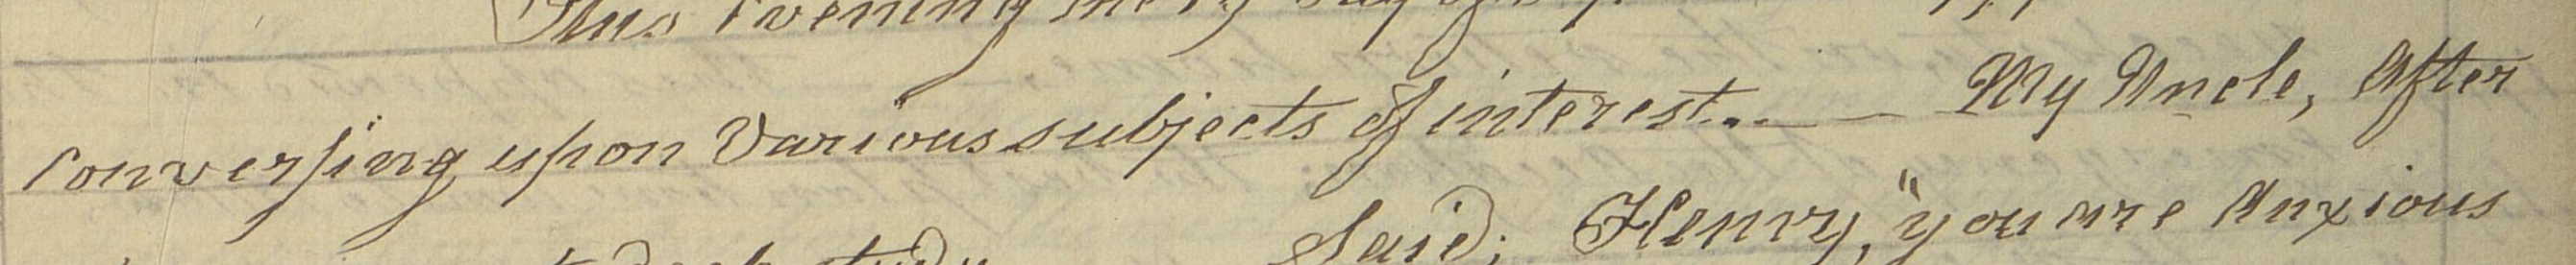conversing upon Various subjects of interest. My Uncle, After
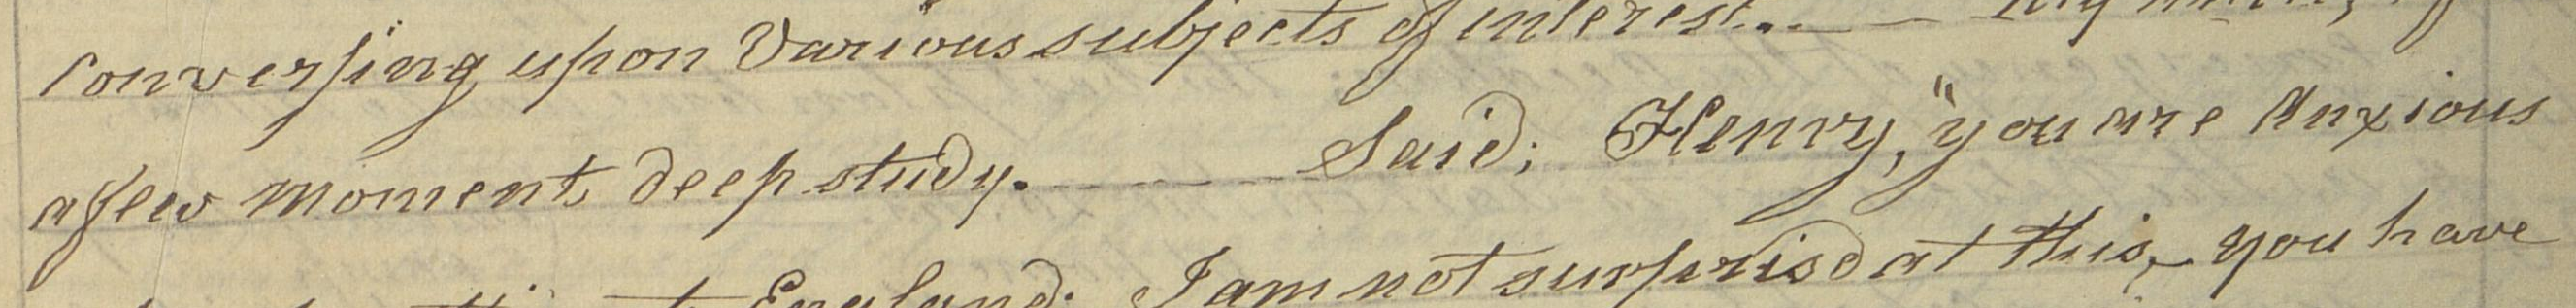a few moment deep study. Said: Henry, "you are anxious
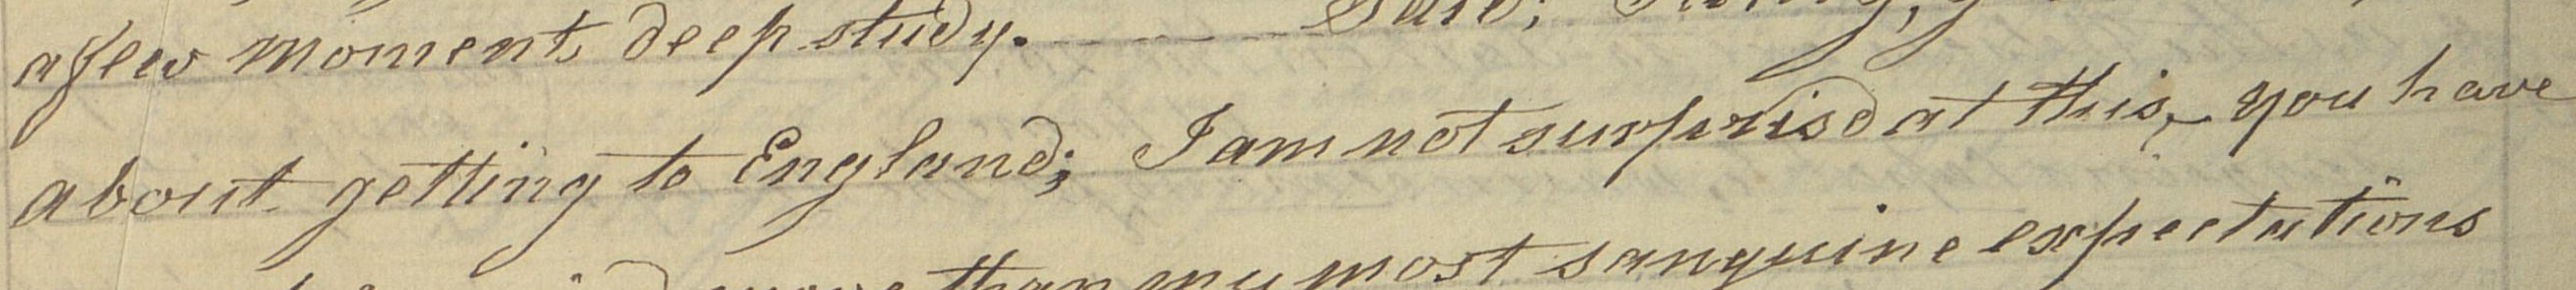about getting to England; I am not surprisd at this; you have
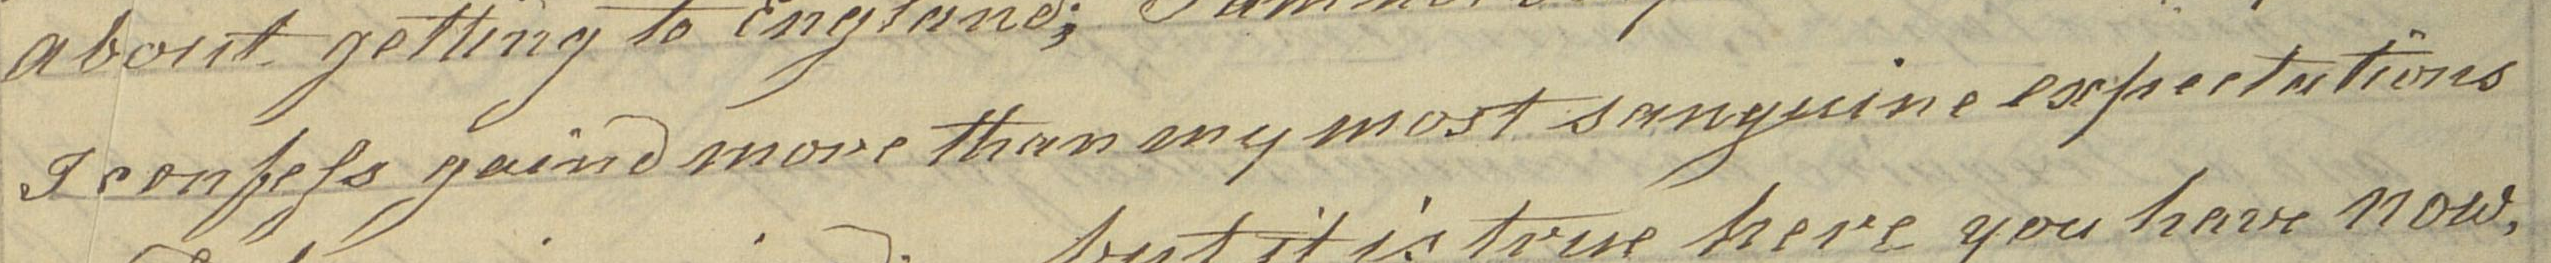I confess gaind more than any most sanguine expectations
